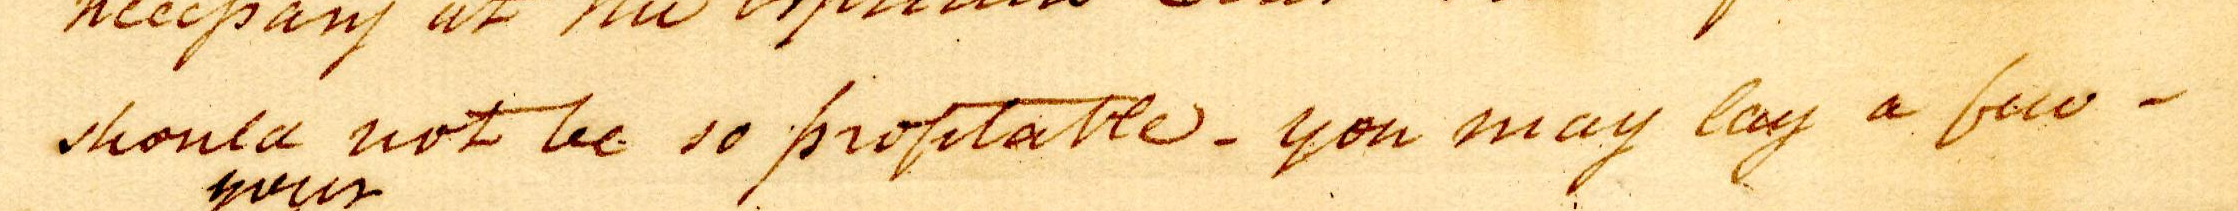should not be so profitable. you may lay a few
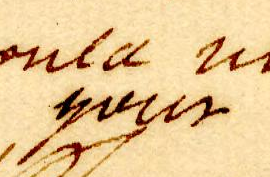your
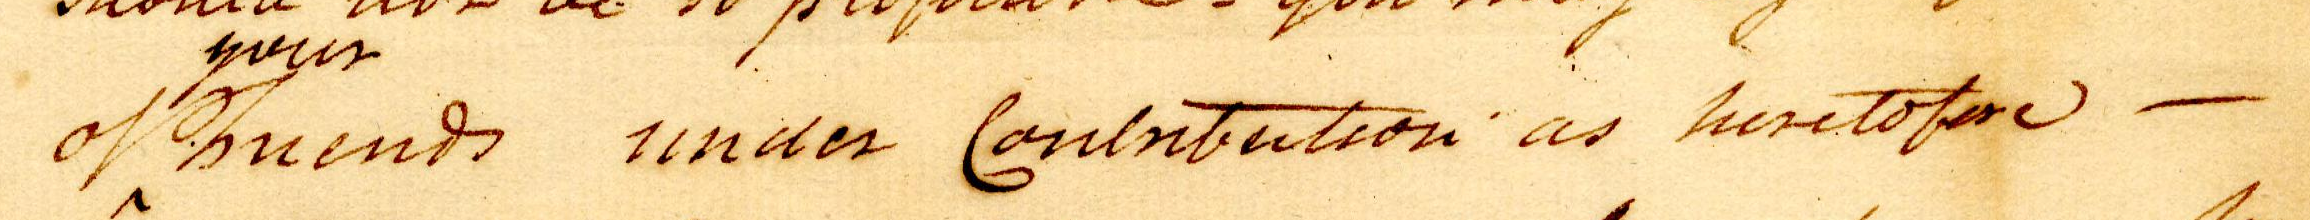of Friends under Contribution as heretofore
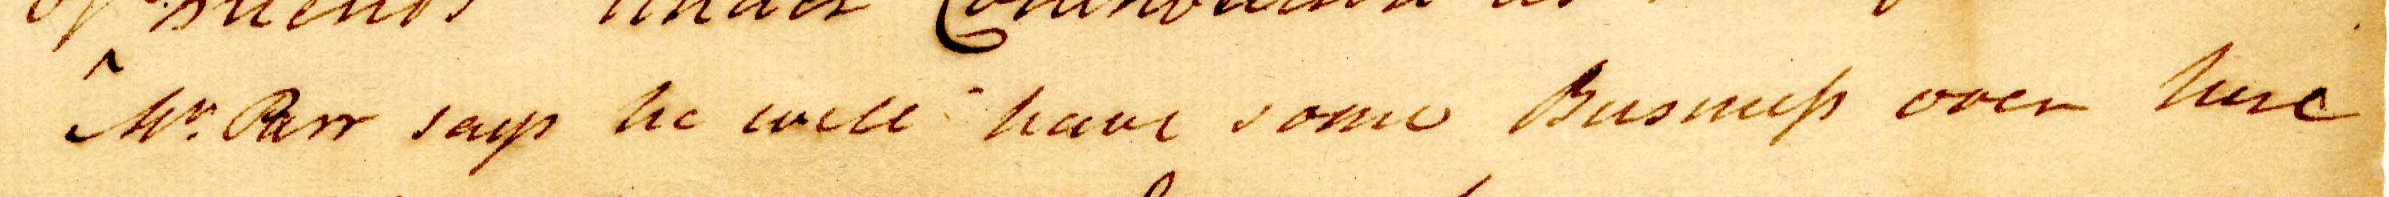M^r. Parr says he will have some Business over here
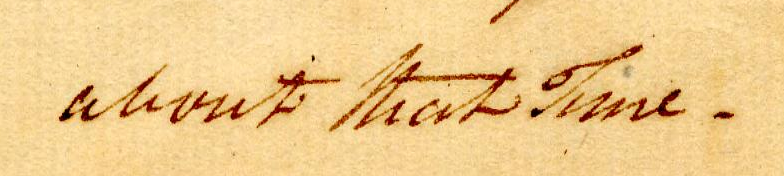about that Time.
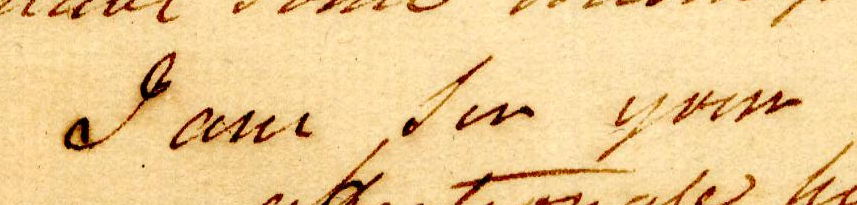I am Sir your
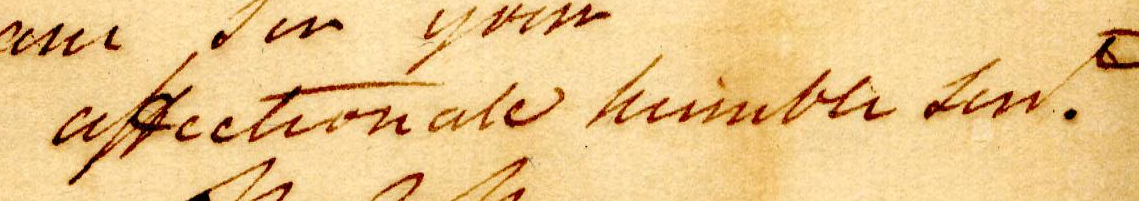affectionate humble Serv^t.
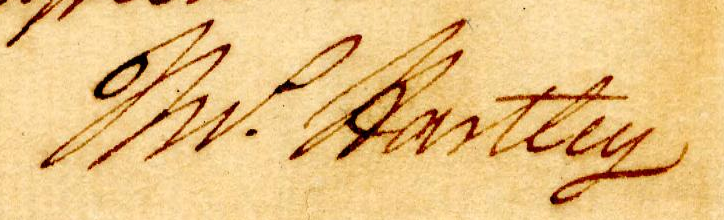Tho^s. Hartley
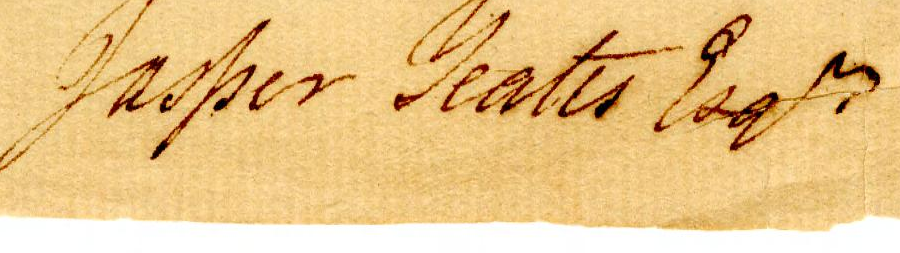Jasper Yeates Esq^r.
